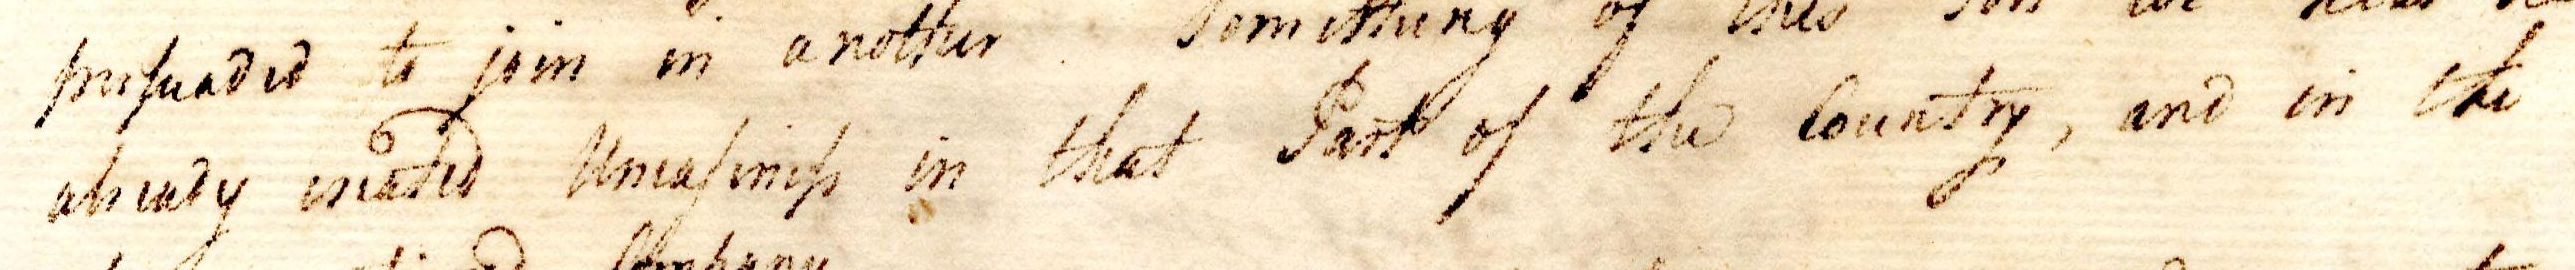already created Uneasiness in that Part of the Country, and in the
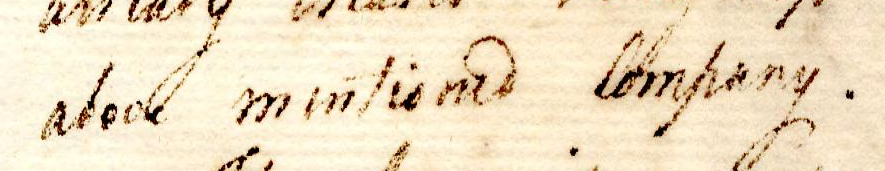above mentioned Company.
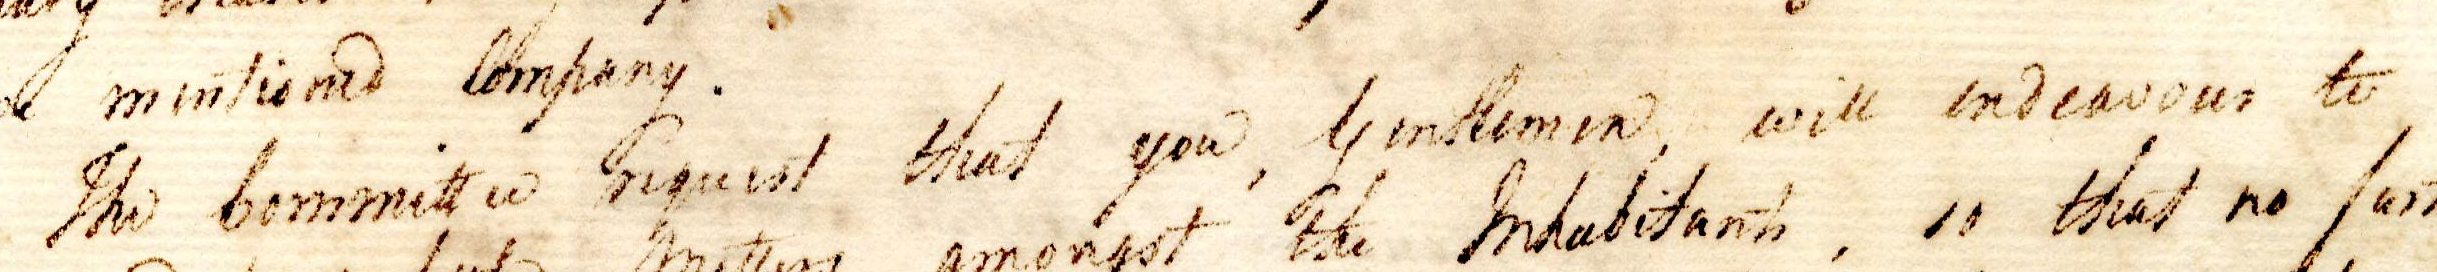The Committee request that you Gentlemen, will endeavour to
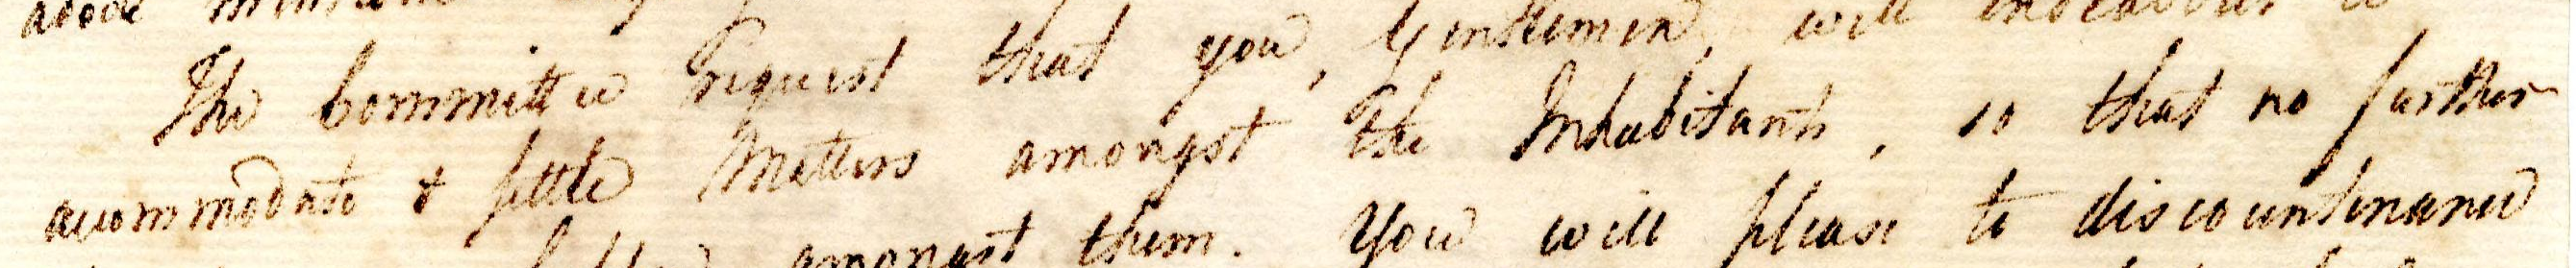accommodate & settle Matters amongst the Inhabitants, so that no further
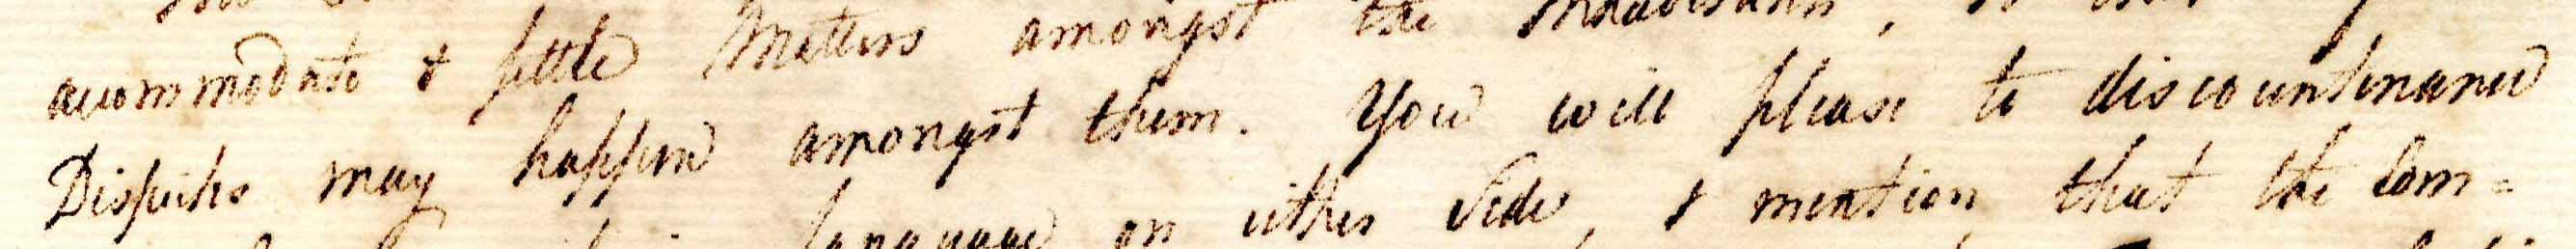Disputes may happen amongst them. You will please to discountenance
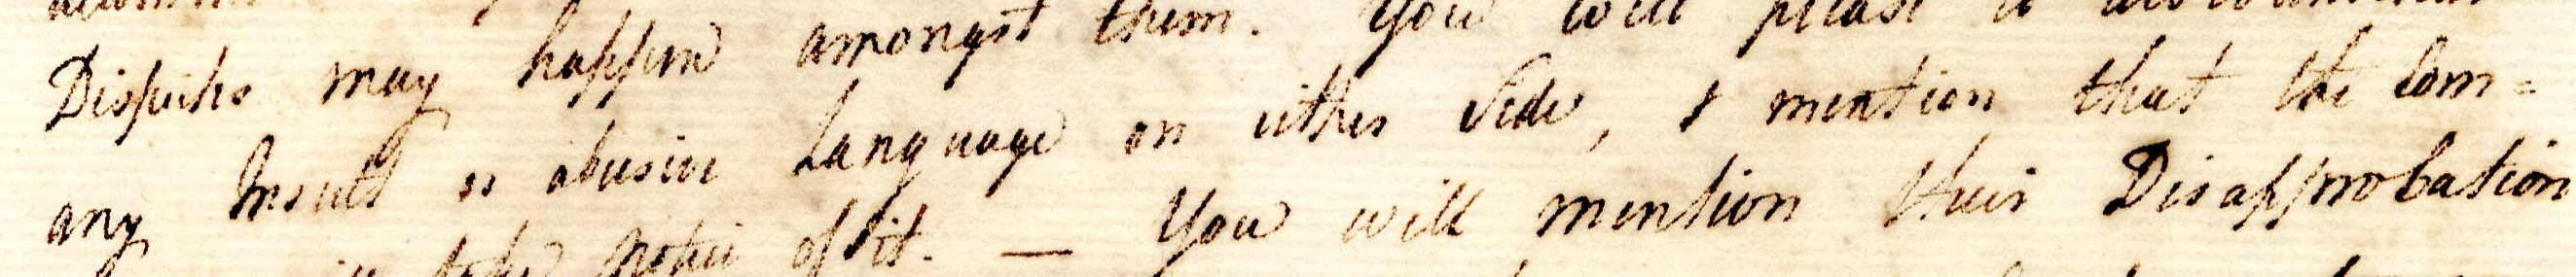any Insult or abusive Language on either side, & mention that the Com-
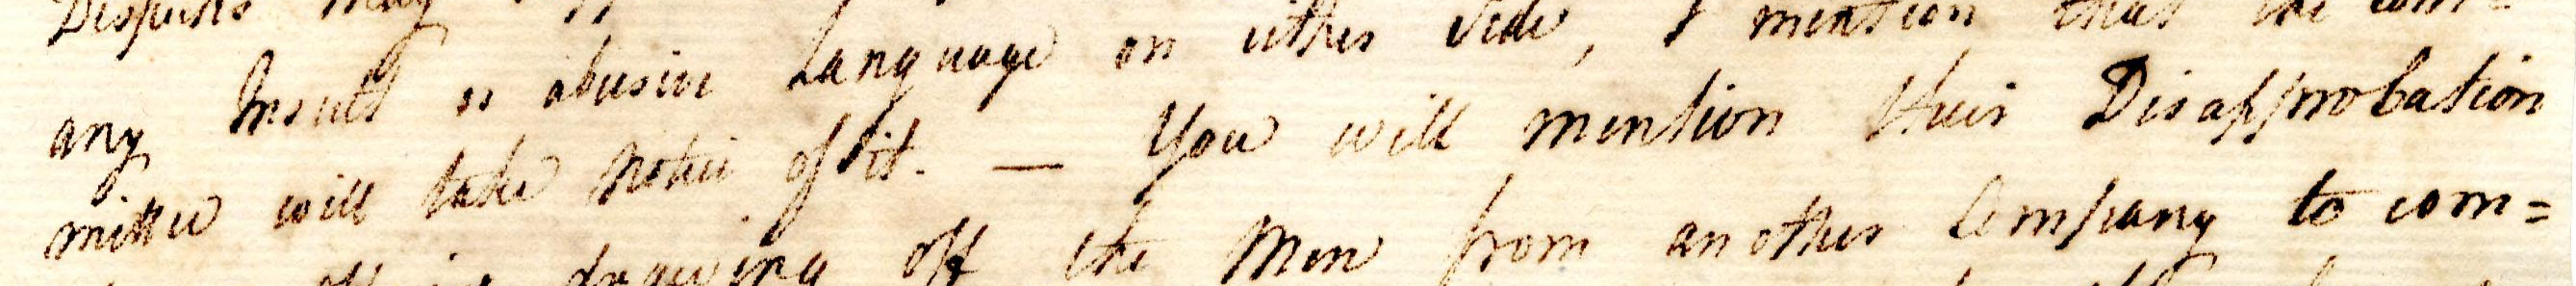mittee will take Notice of it. You will mention their Disapprobation
